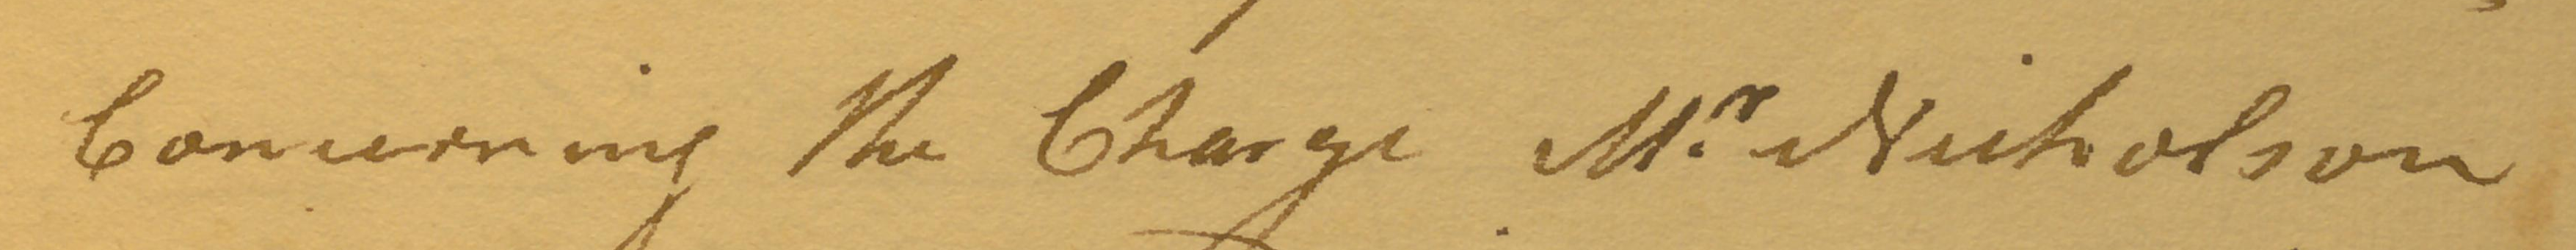Concerning the Charge M^r. Nicholson
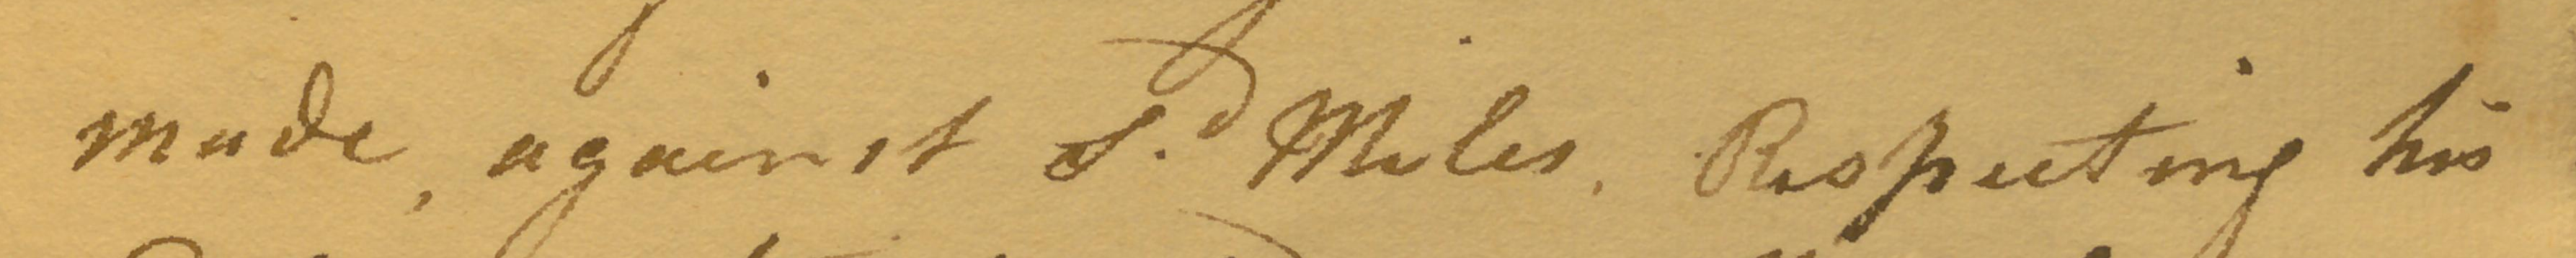made against s^d. Miles. Respecting his
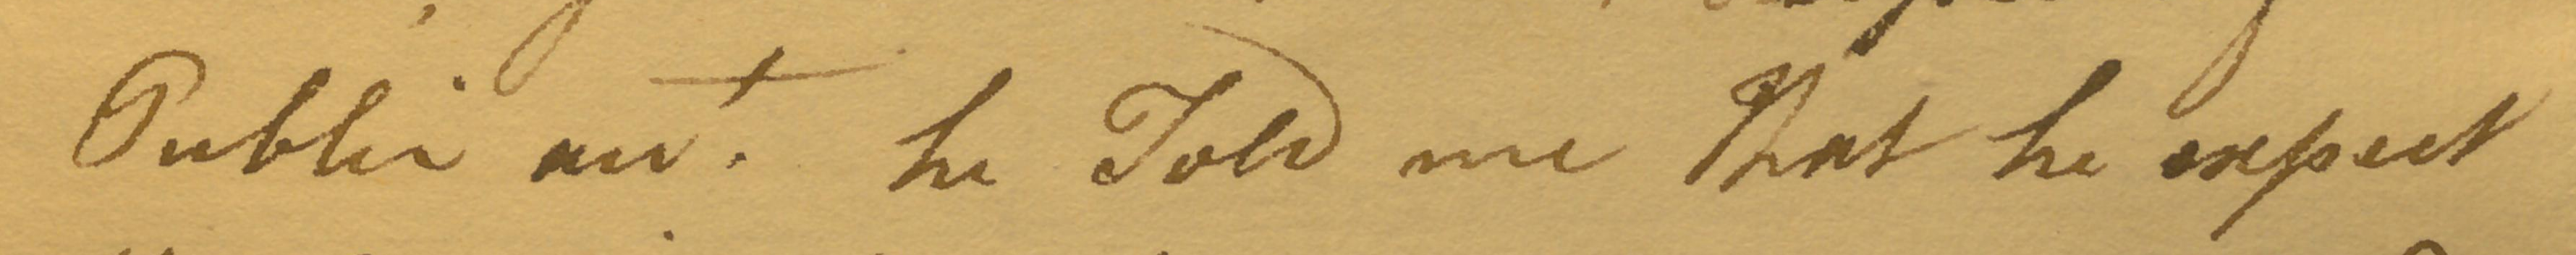Public acc^t. he Told me that he expect
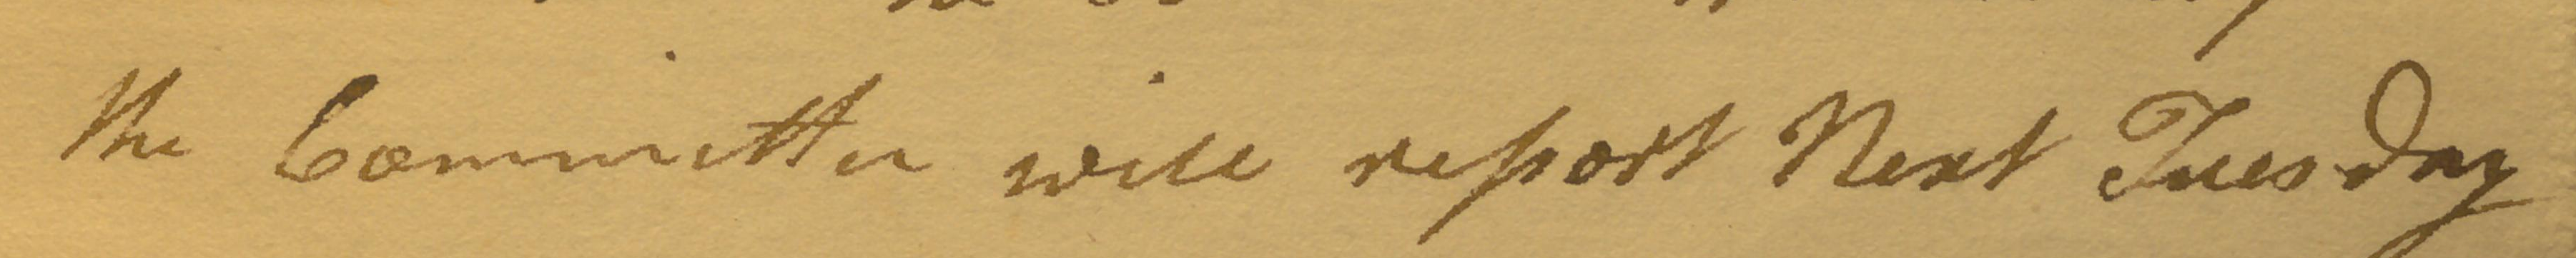the Committee will report Next Tuesday
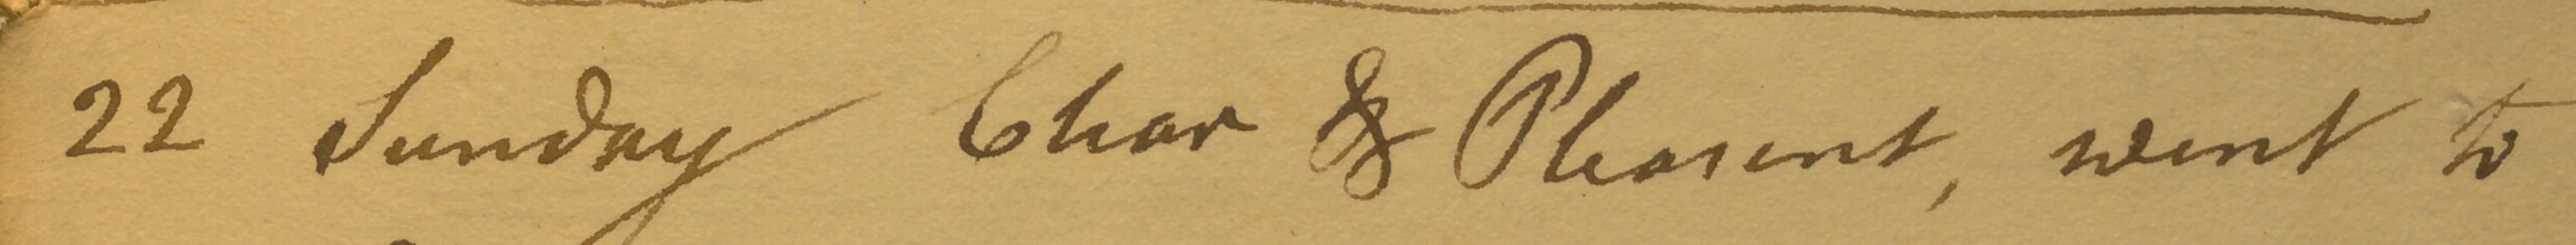22 Sunday Clear & Pleasent went to
